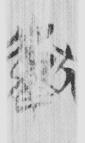獻
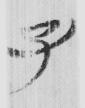子
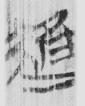進
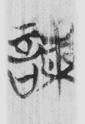諫
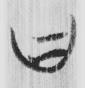曰
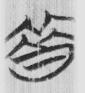昔
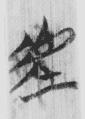𫊟
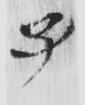子
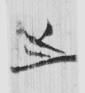之
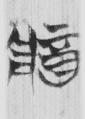𨟻
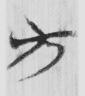方
